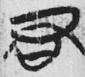君
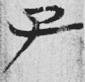子
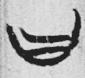曰
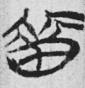昔
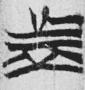者
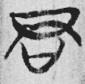君
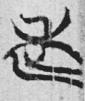老
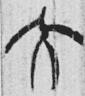大（太）
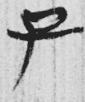子
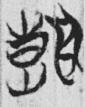朝
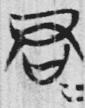君君
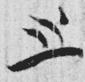之
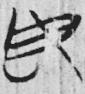母（母）
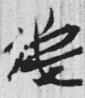俤（弟）
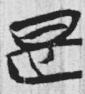是
